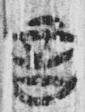言
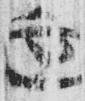正（政）
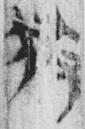敓
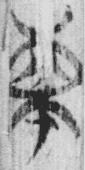柬（簡）
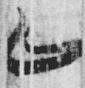㠯（以）
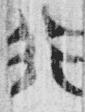行
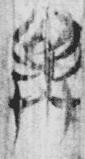與
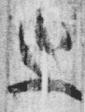之
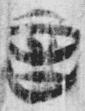言
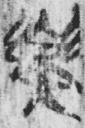樂
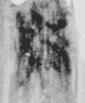敓
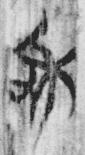和
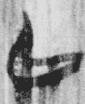㠯（以）
